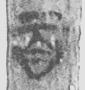百
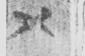五
